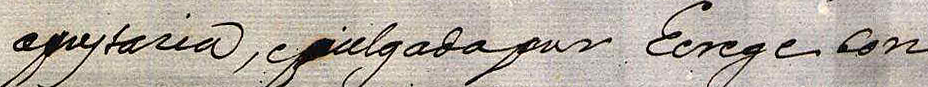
apostazia, e julgada por herege con
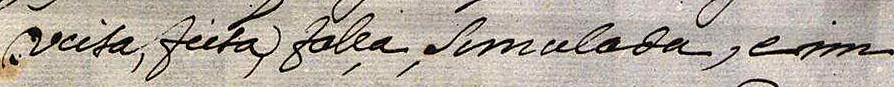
victa, feita, falça, simulada, e im
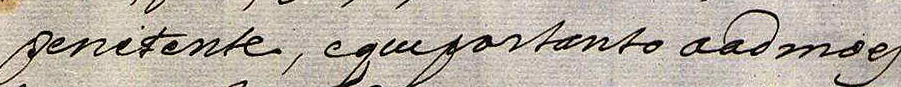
penitente, e que portanto a admoes
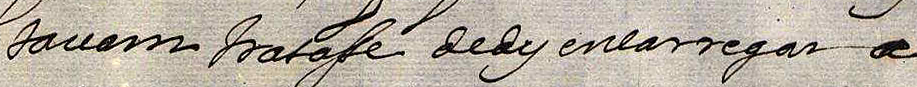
tauam tratasse de disencarregar a
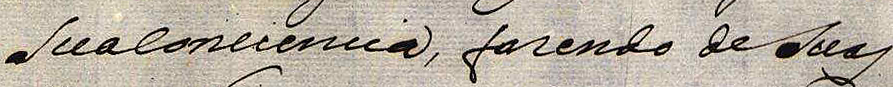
sua conciencia, fazendo de suas
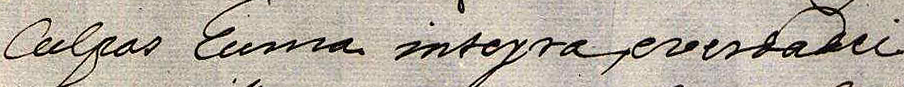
Culpas huma inteyra, e verdadei
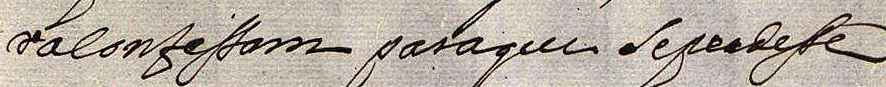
ra confessam para que se pudese
